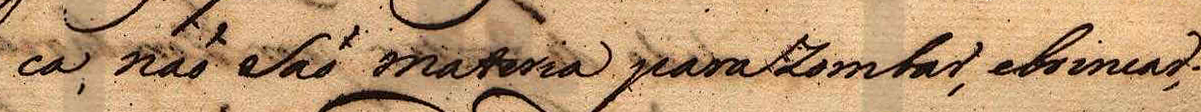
ca, naõ saõ materia para Zombar, e brincar;
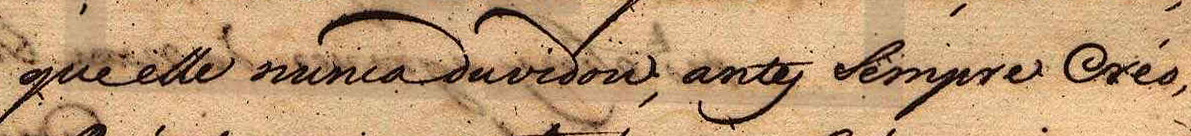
que elle nunca duvidou, antes sempre Créo,
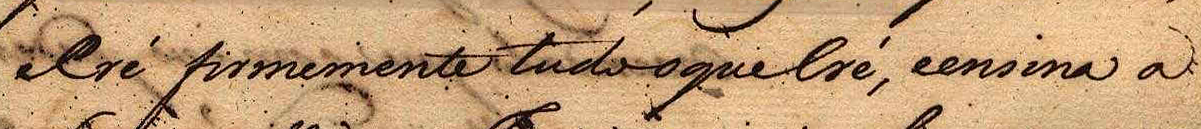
e Cré firmemente tudo o que Cré, e ensina a
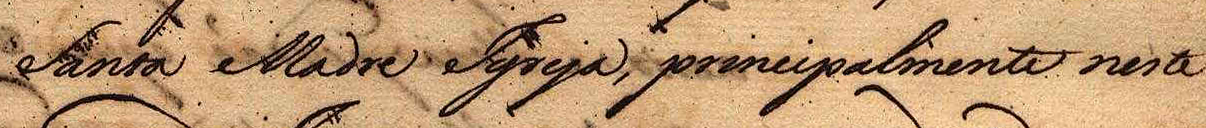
Santa Madre Igreja, principalmente neste
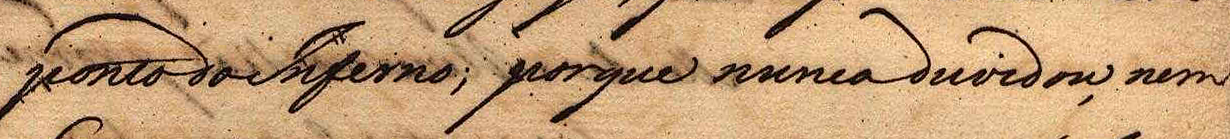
ponto do Inferno; porque nunca duvidou, nem
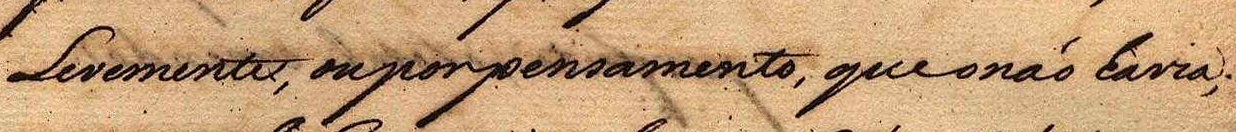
Levemente, ou por pensamento, que o naõ havia;
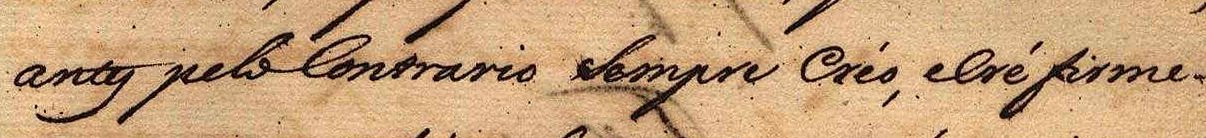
antes pelo Contrario Sempre Créo, e Cré firme
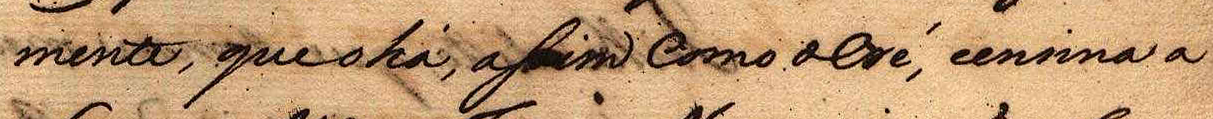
mente, que o há, assim como o Cré, e ensina a
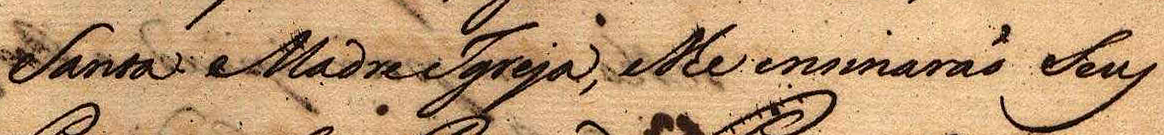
Santa Madre Igreja, e lhe ensinaraõ Seus
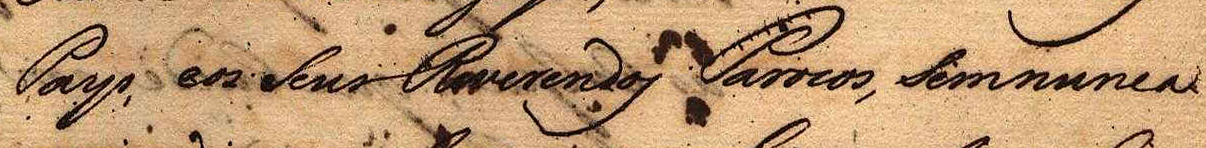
Pays, e os seus Reverendos Parocos, sem nunca
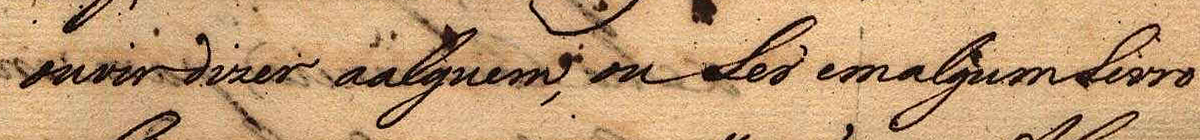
ouvir dizer a alguem, ou Ler em algum Livro
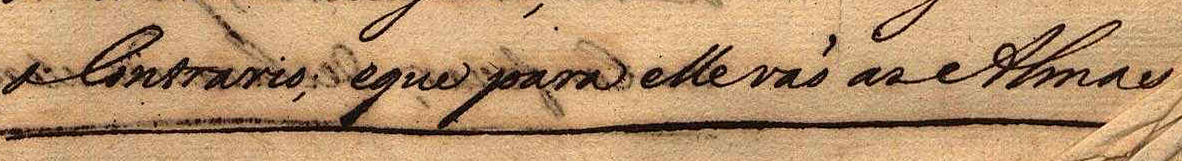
o Contrario; e que para elle vaõ as Almas
